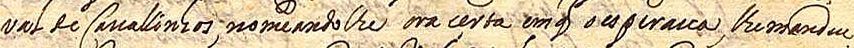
val de Cauallinhos, nomeandolhe ora certa em q̄ o esperaua, lhe mandou
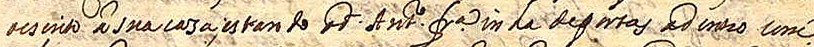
o escrito â sua casa; estando o d̄ Anto. fra. inda de portas adentro com
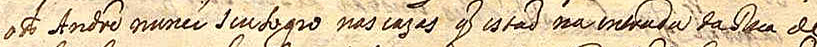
o d̄ Andrē nunez seu sogro nas cazas q̄ estaõ na entrada da Rua de
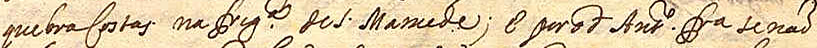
quebra Costas na frega. de S. Mamede; e por o d̄ Anto. fra se naõ
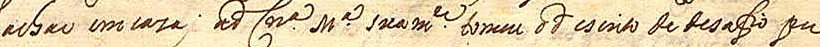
achar em caza; a d̄ Cna. Ma. sua mer. tomou o d̄ escrito de desafio por
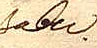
saber
